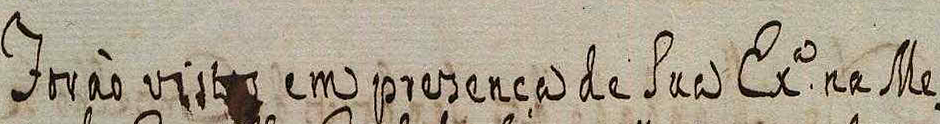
Foraõ vist_s em presença de Sua Ex.a na Me
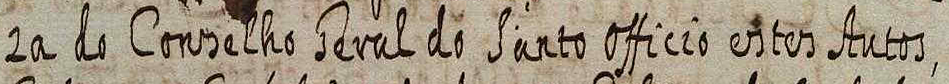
za do Conselho Geral do Santo Officio estes Autos,
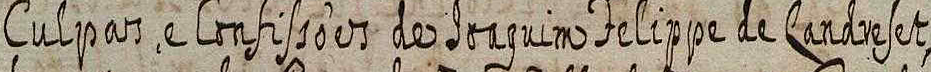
Culpas, e Confissões de Joaquim Felippe de Landreset,
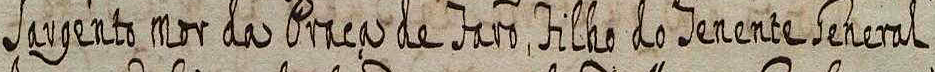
Sargento mor da Praça de Faro, Filho do Tenente General
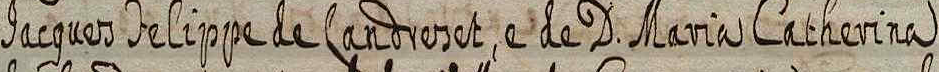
Iacques Felippe de Landreset, e de D. Maria Catherina
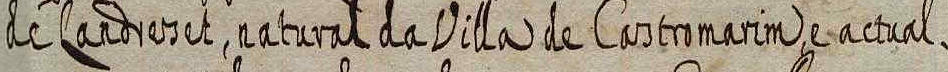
de Landreset, natural da Villa de Castro marim, e actual
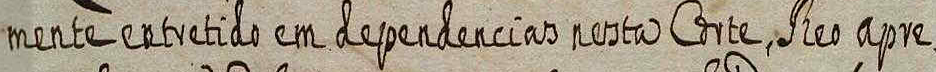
mente entretido em dependencias nesta Corte, Reo apre
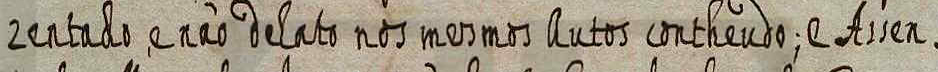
zentado, e não delato nos mesmos autos contheudo; e Assen
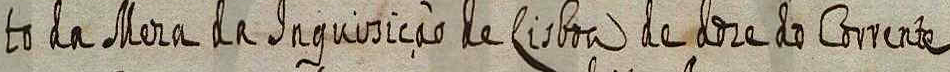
to da Meza da Inquisição de Lisboa de doze do Corrente
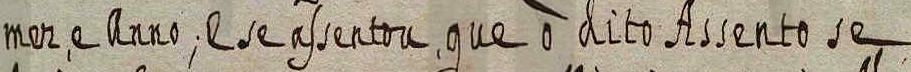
mez e anno. e se assentou, que o dito Assento se
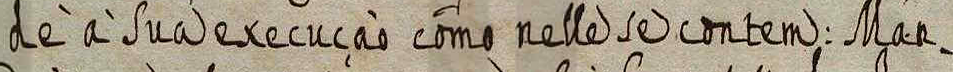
dè à Sua execução como nelle se contem: Man
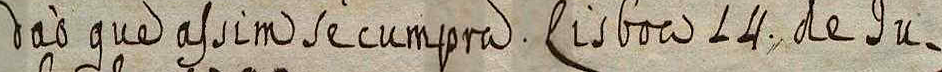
daõ que assim se cumpra. Lisboa 14. de Iu
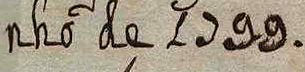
nho de 1799.
